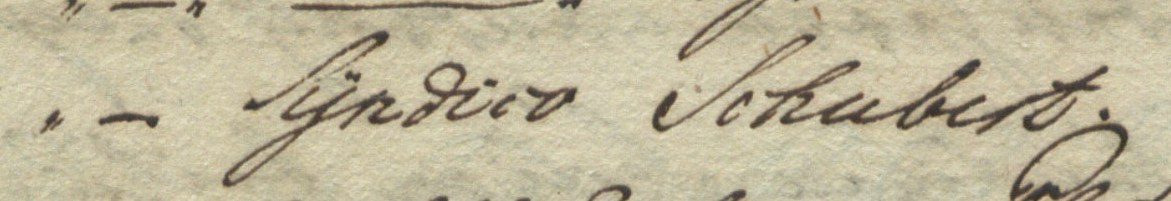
Sÿndico Schubert.
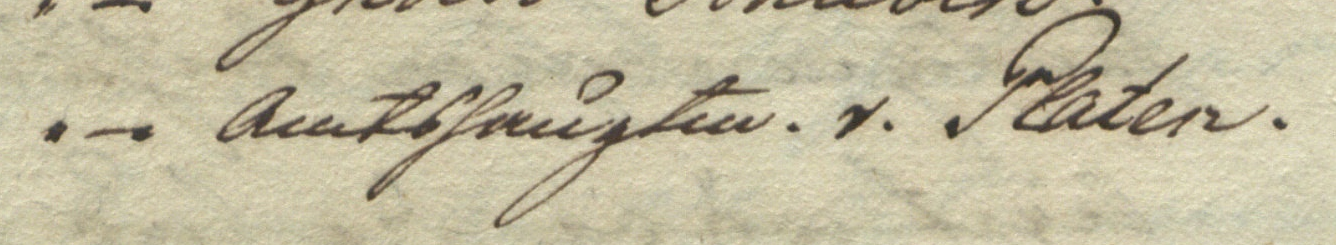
Amtshauptm. v. Platen.
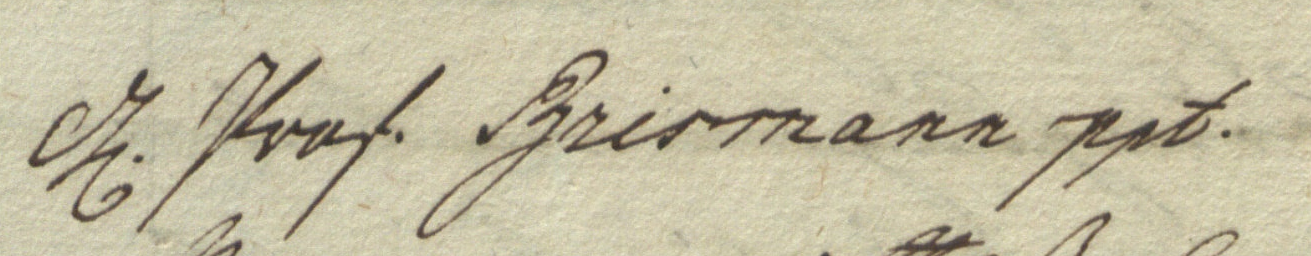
dh. Prof. Brismann ppt.
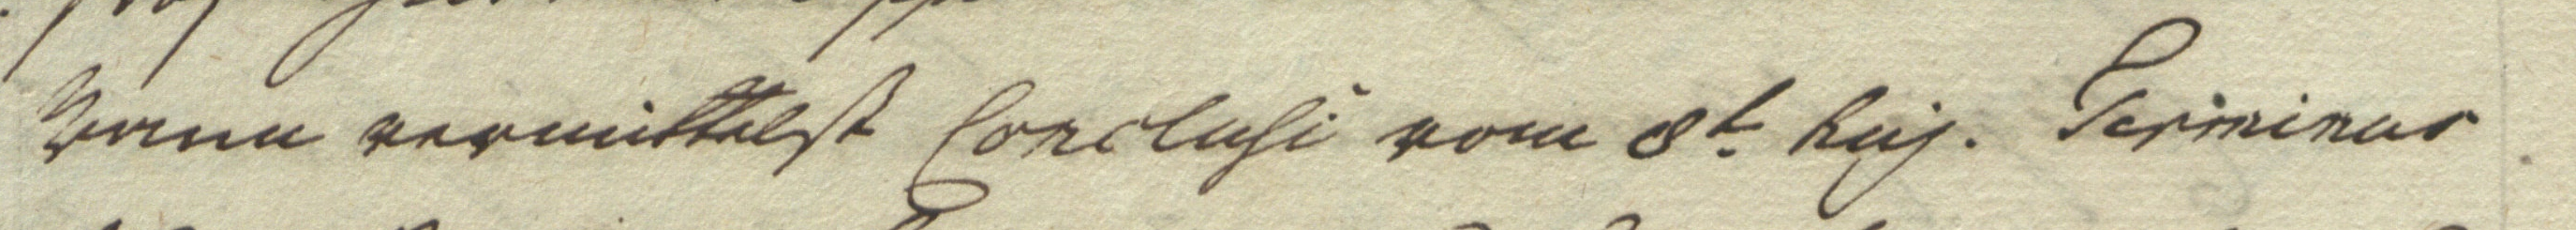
Wann vermittelst Conclusi vom 8 t huj. Terminus
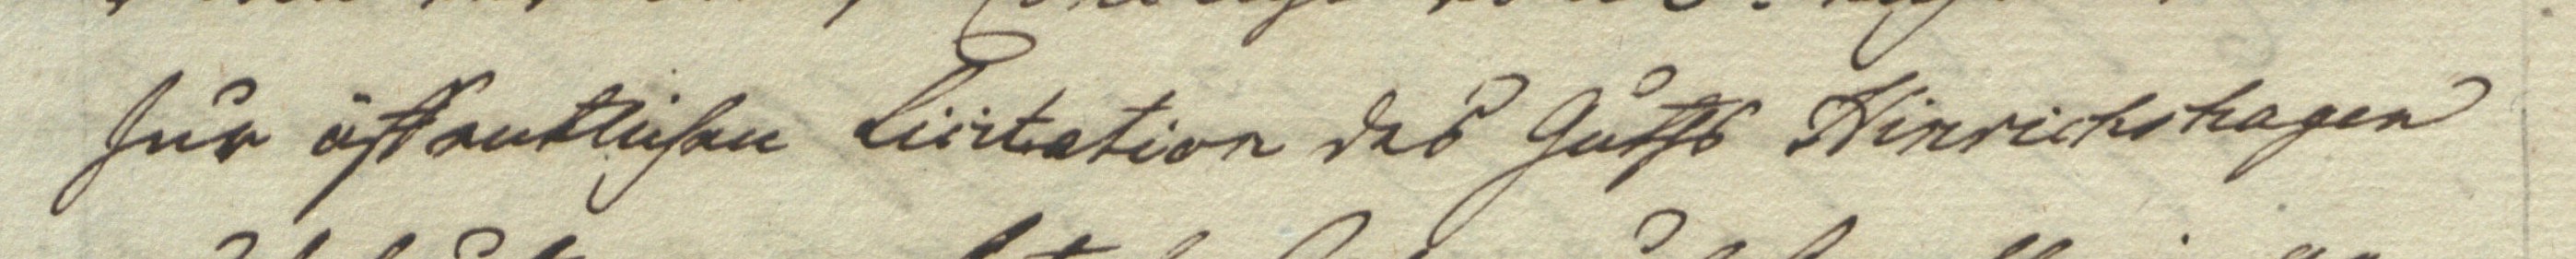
zur öffentlichen Licitation des Guths Hinrichshagen
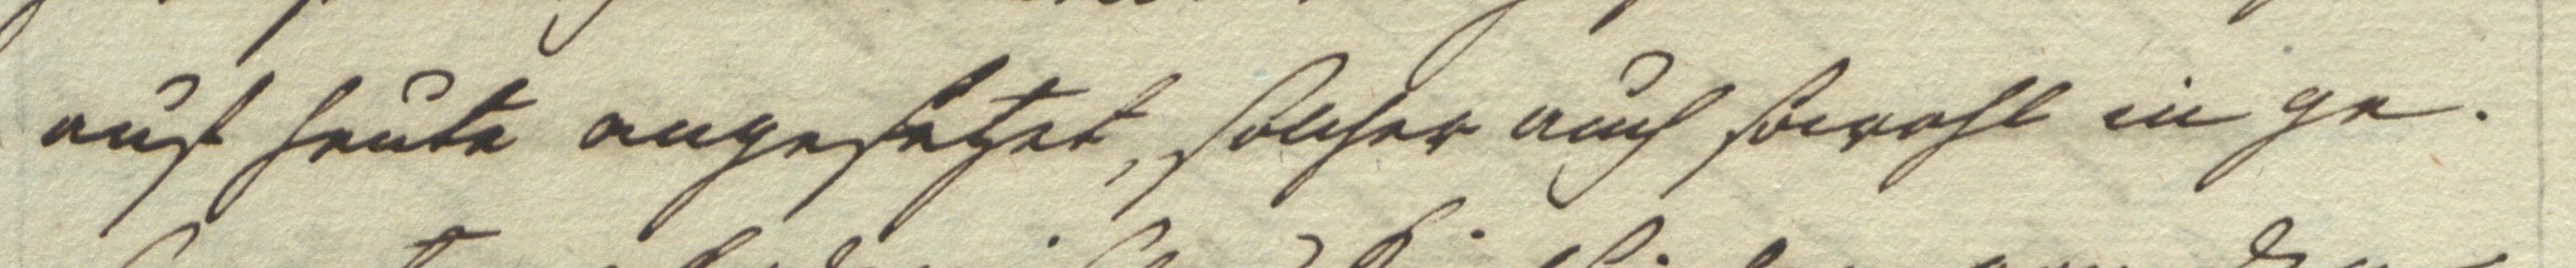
auf heute angesetzet, solcher auch sowohl in ge¬
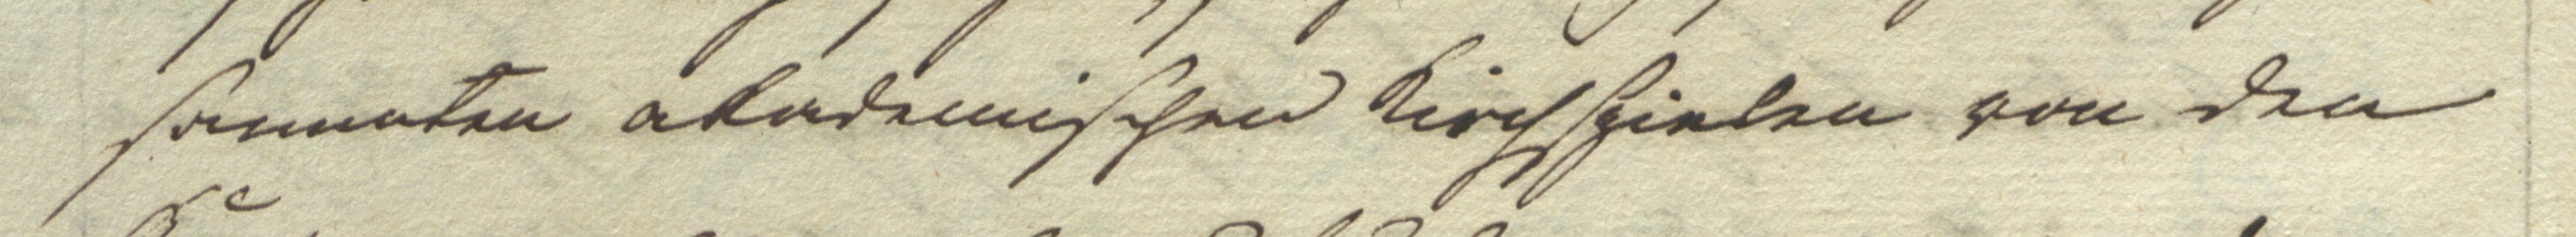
sammten akademischen Kirchspielen von den
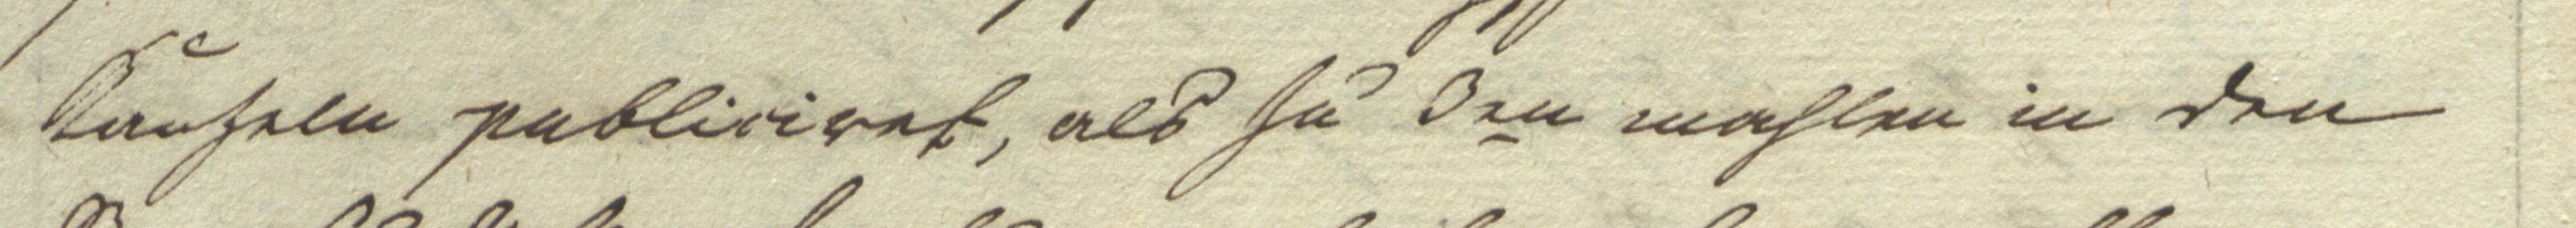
Kanzelm publiciret, als zu den mahlen in den
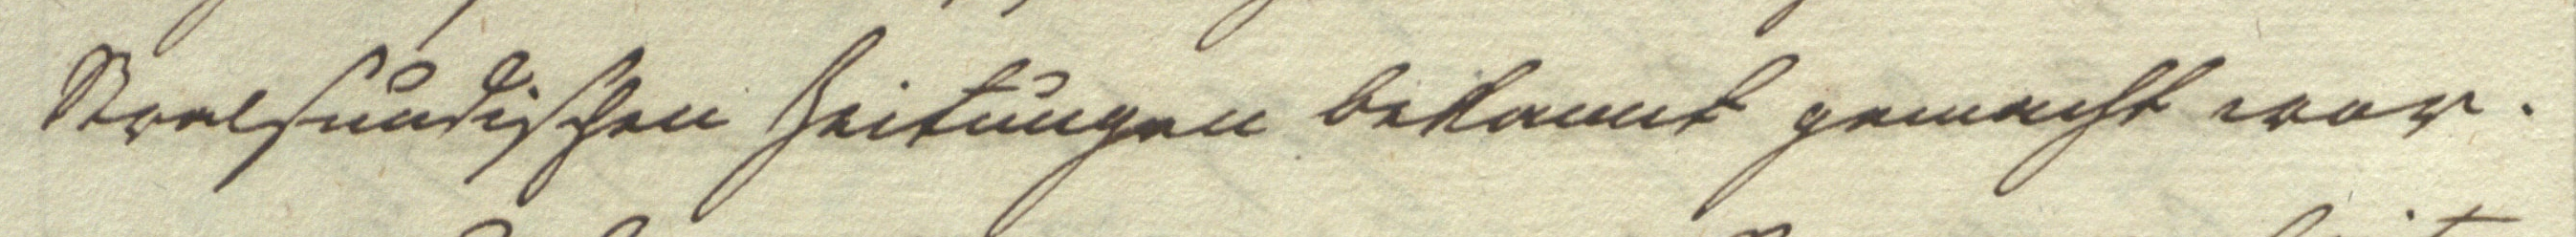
Stralsundischen Zeitungen bekannt gemacht wor¬
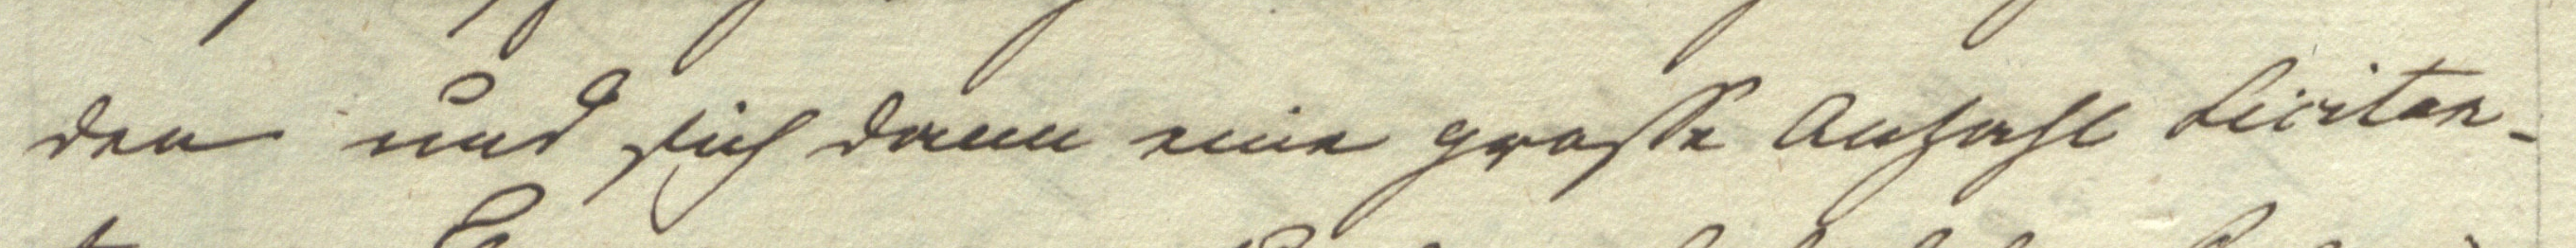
den und sich dann eine grosse Anzahl Licitan¬
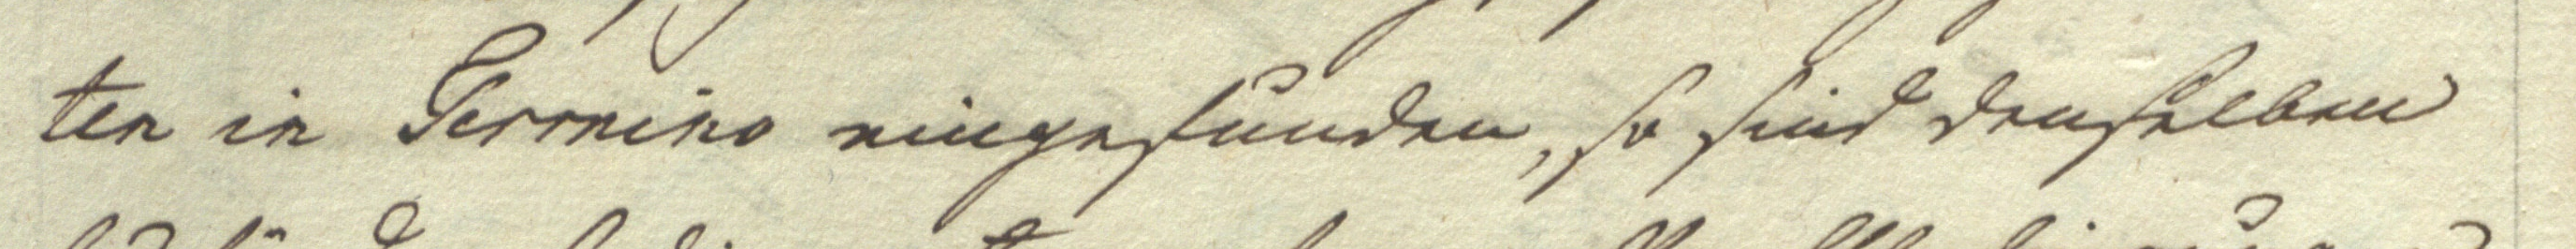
ten in Termino eingefunden, so sind denselben
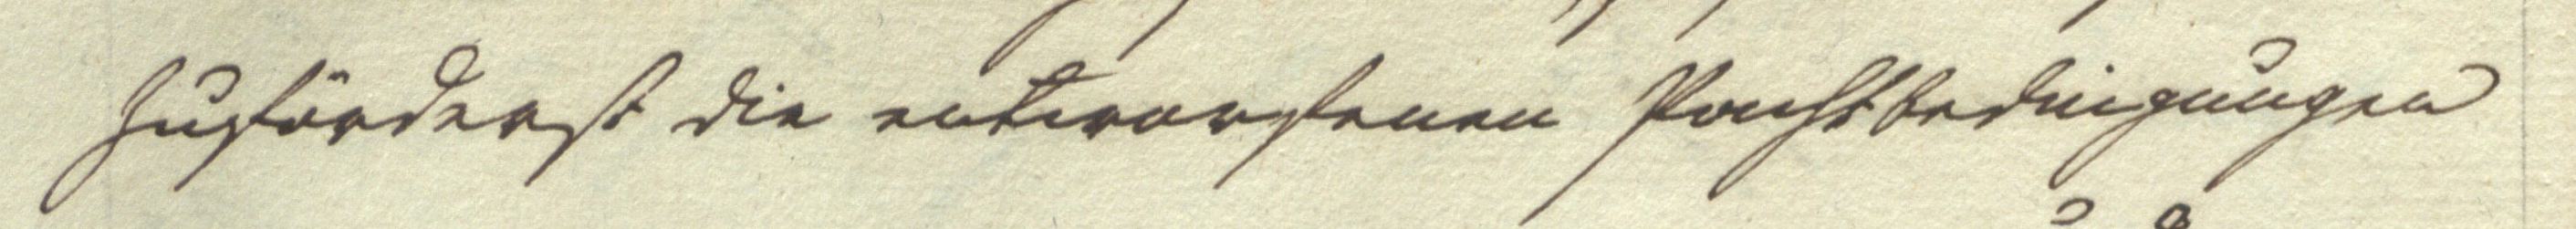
zuförderst die entworfenen Pachtbedingungen
